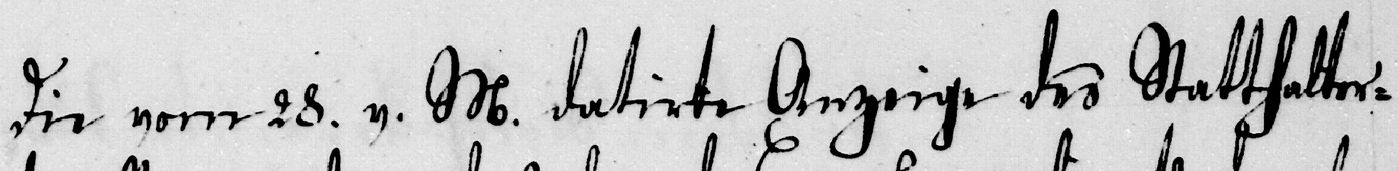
Die vom 28. v. M. datirte Anzeige des Statthalter¬
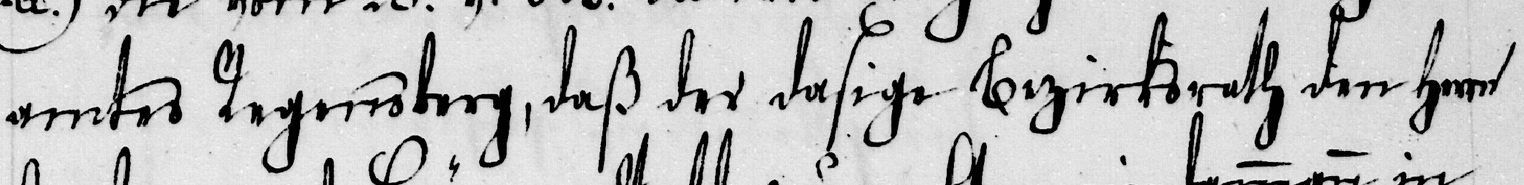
amtes Regensberg, daß der dasige Bezirksrath den Herrn
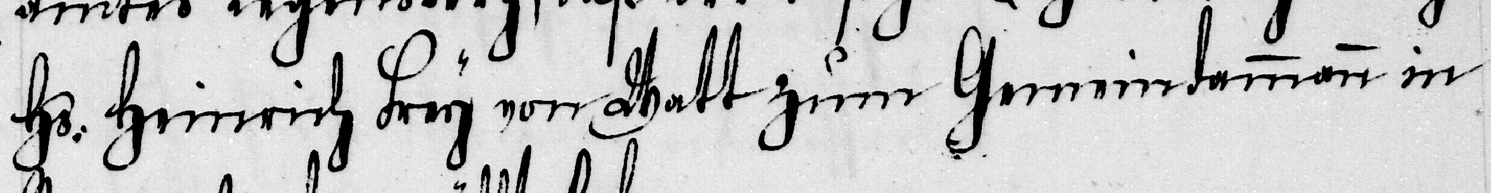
Hs. Heinrich Frey von Watt zum Gemeindammann in
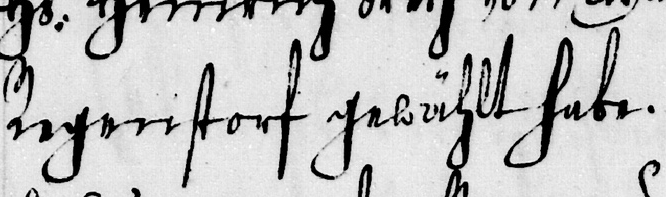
Regenstorf gewählt habe.
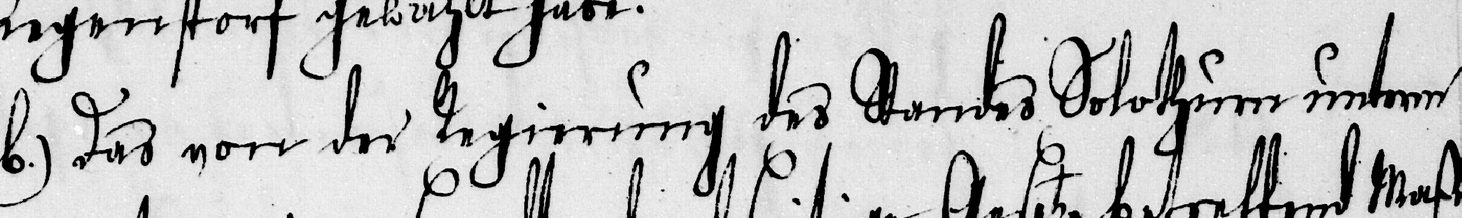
b.) Das von der Regierung des Standes Solothurn unterm
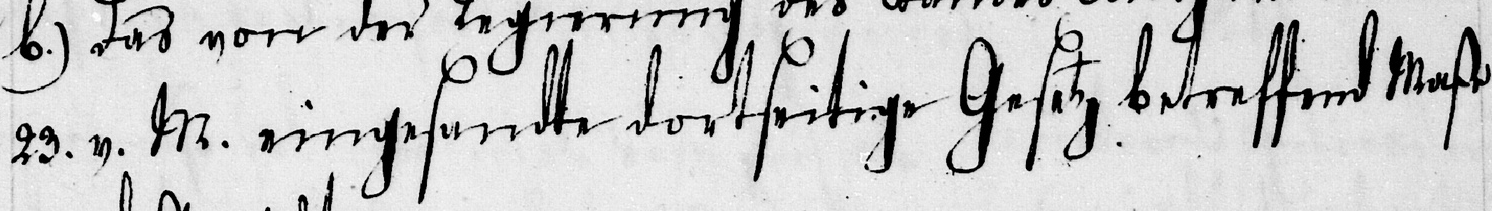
23. v. M. eingesandte dortseitige Gesetz betreffend Maße
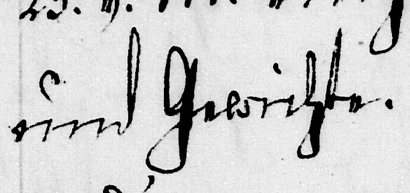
und Gewichte.
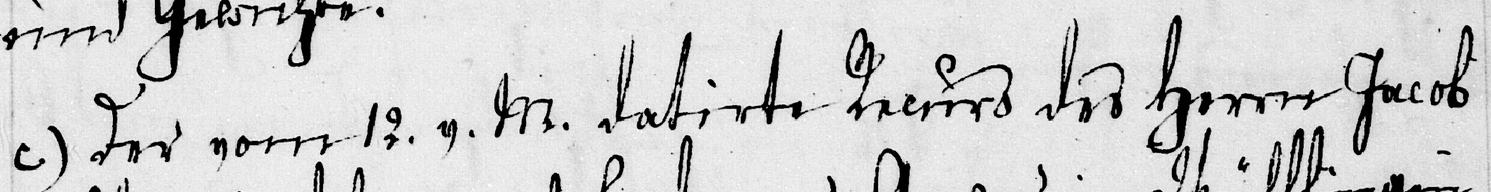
c.) Der vom 12. v. M. datirte Recurs des Herrn Jacob
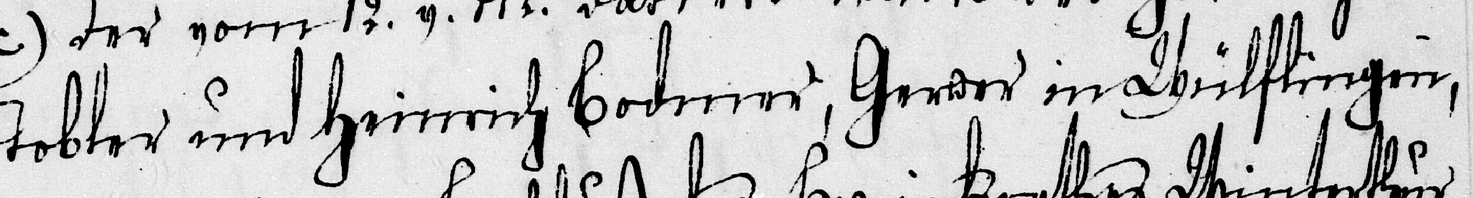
Tobler und Heinrich Bodmer, Gerwer in Wülflingen,
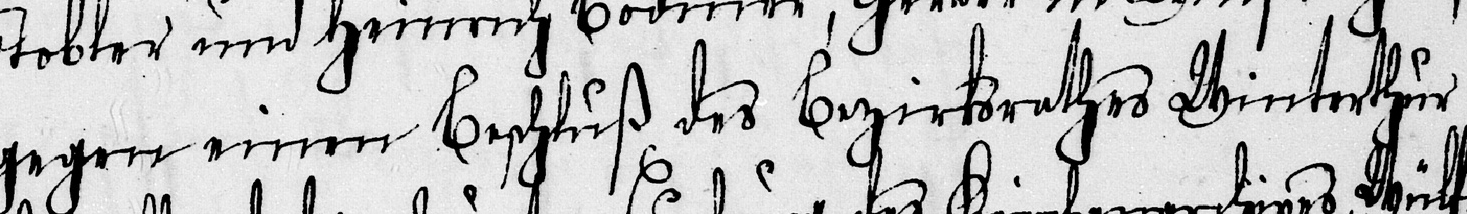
gegen einen Beschluß des Bezirksrathes Winterthur
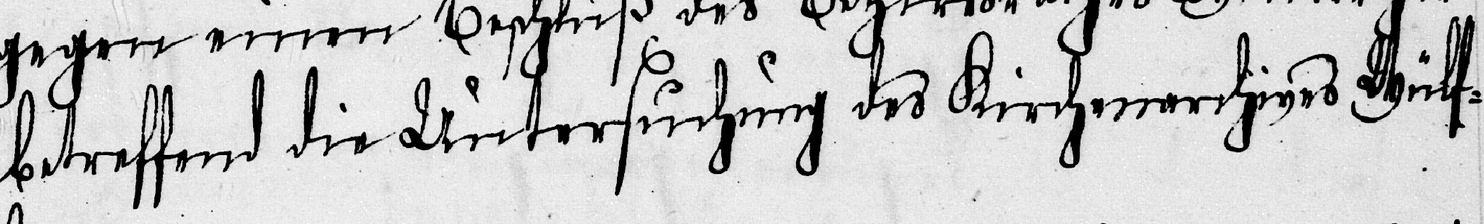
betreffend die Untersuchung des Kirchenarchives Wülf¬
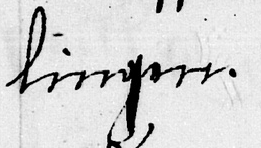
lingen.
